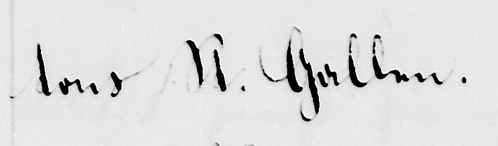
tons St. Gallen.
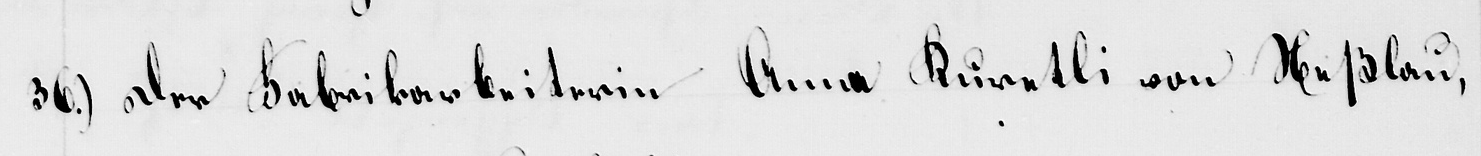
36.) der Fabrikarbeiterin Anna Kuretli von Neßlau,
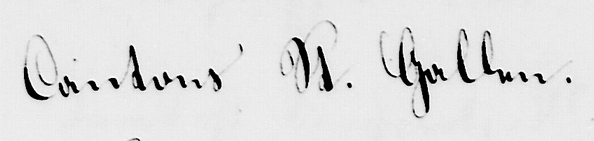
Cantons St. Gallen.
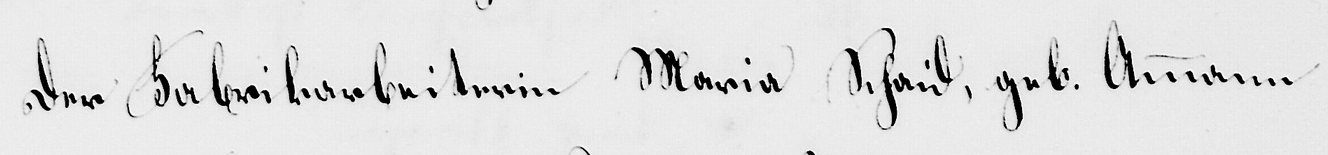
die Fabrikarbeiterin Maria Schaid, geb. Ammann
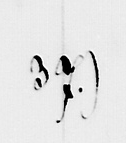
37.)
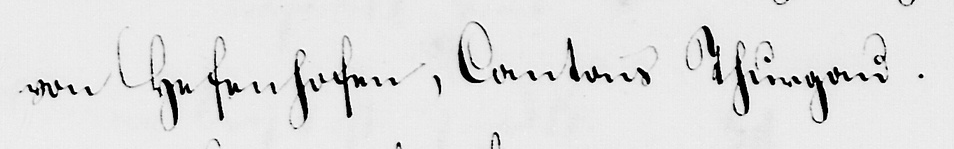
von Hefenhofen, Cantons Thurgau.
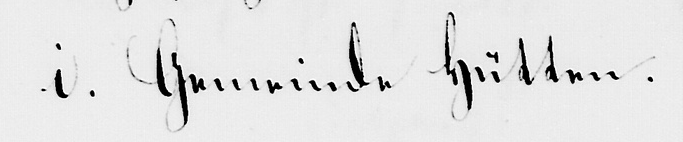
i. Gemeinde Hütten.
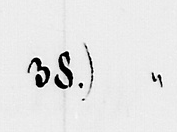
38.)
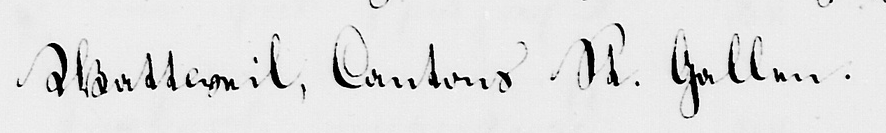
Wattweil, Cantons St. Gallen.
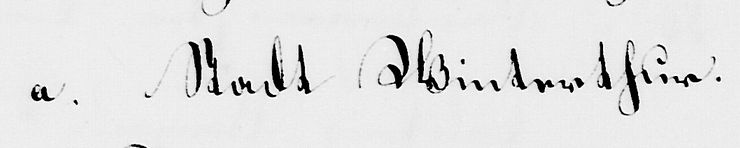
a. Stadt Winterthur.
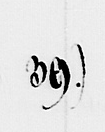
39.)
